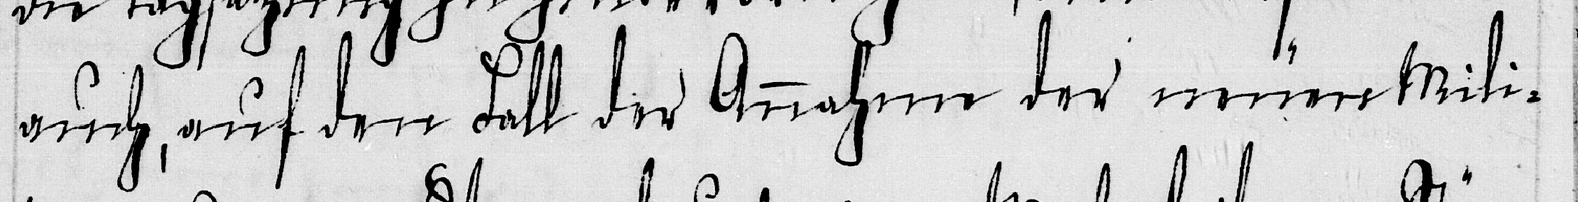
auch, auf den Fall der Annahme der neuen Mili¬
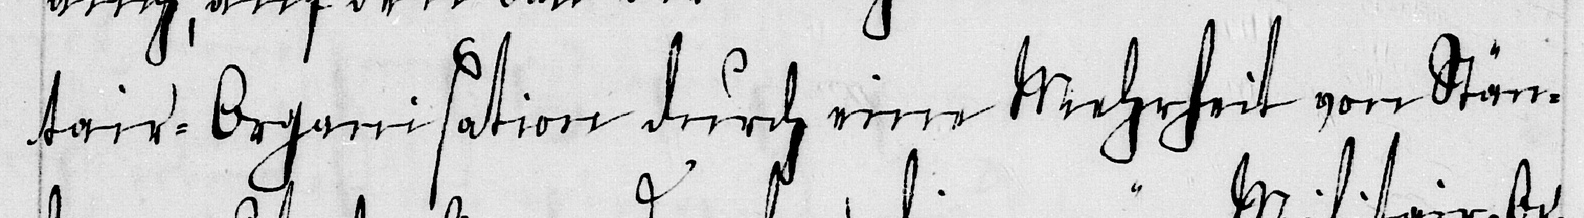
tair-Organisation durch eine Mehrheit von Stän¬
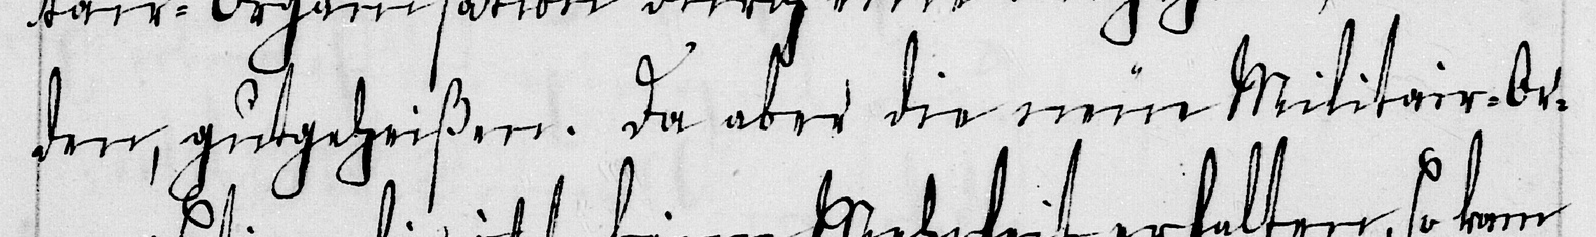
den, gutgeheißen. Da aber die neue Militair-Or¬
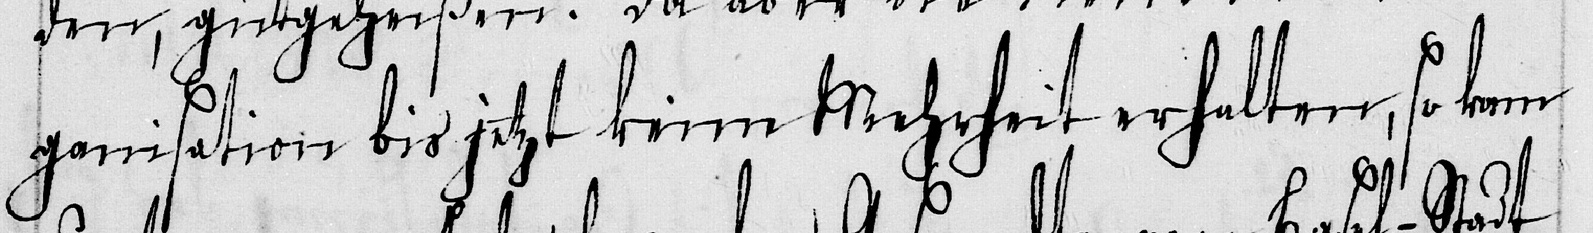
ganisation bis jetzt keine Mehrheit erhalten, so kam
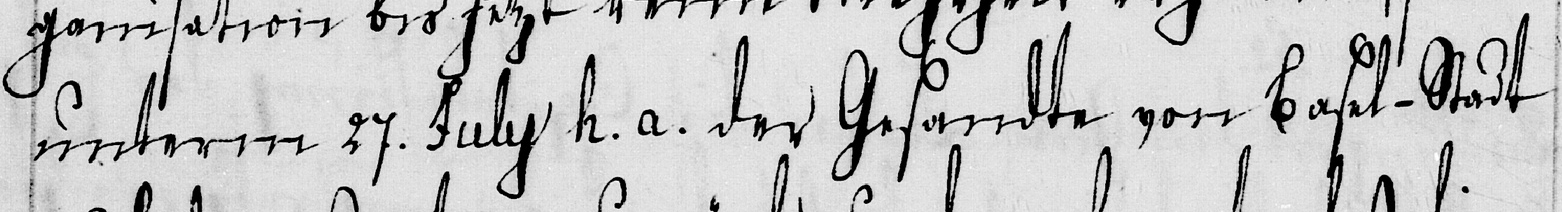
unterm 27. July h. a. der Gesandte von Basel-Stadt
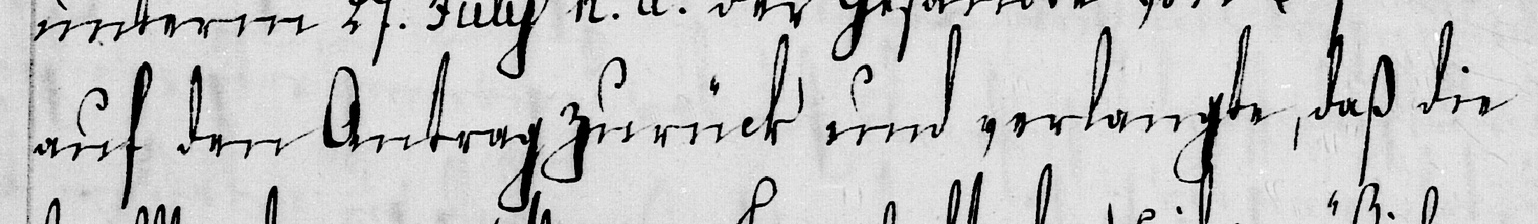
auf den Antrag zurück und verlangte, daß die
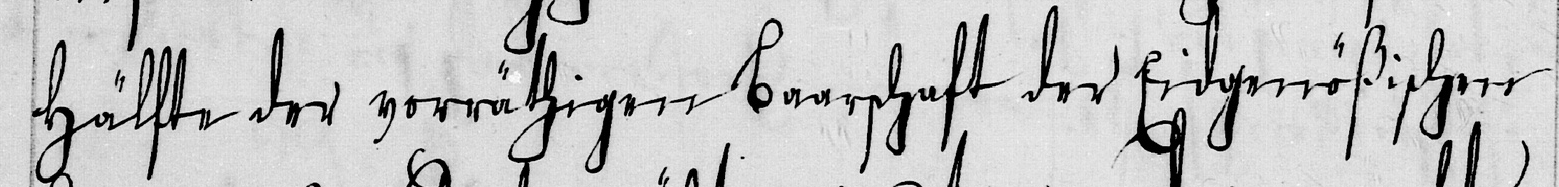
Hälfte der vorräthigen Baarschaft der Eidgenößischen
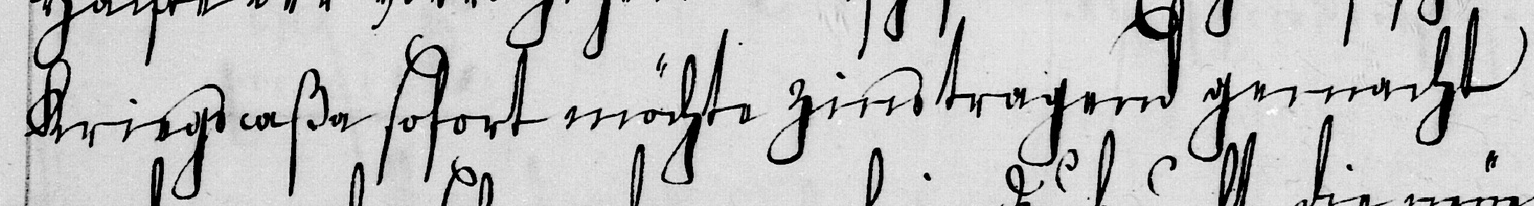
Kriegscaßa sofort möchte zinstragend gemacht
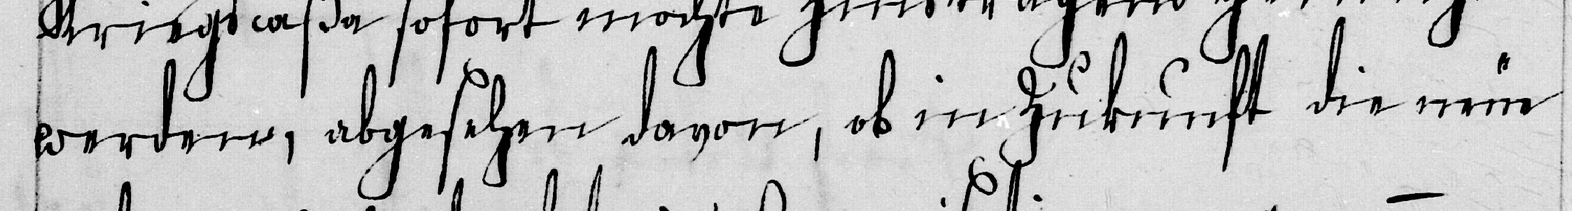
werden, abgesehen davon, ob in Zukunft die neue
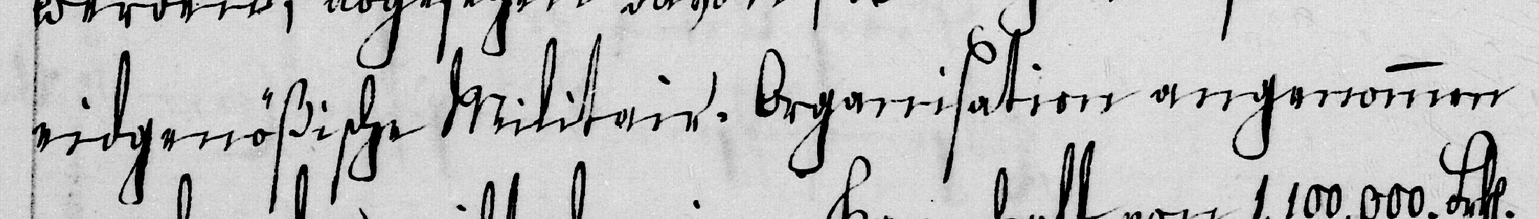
eidgenößische Militair-Organisation angenommen
